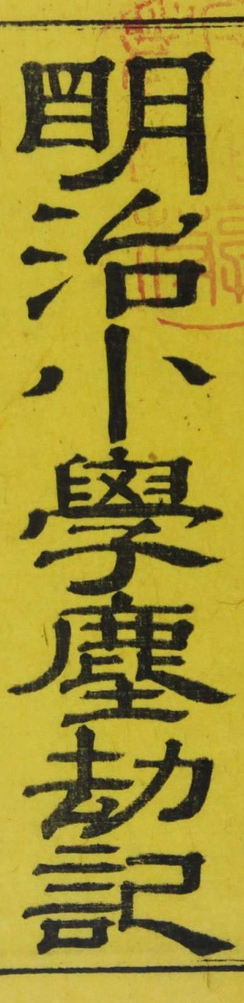明治小学塵劫記
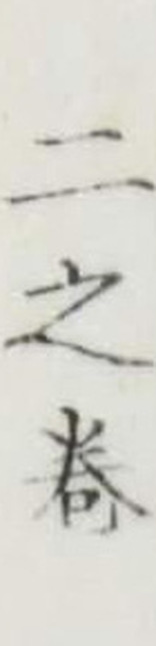二之巻
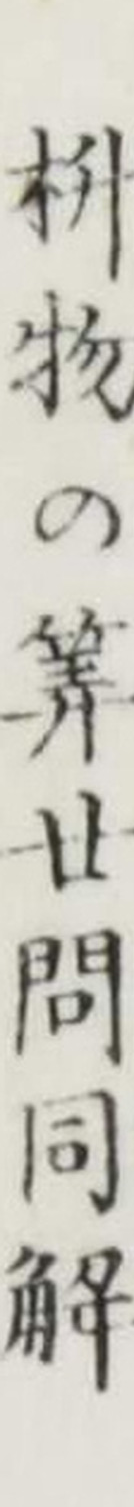桝物の算廿問同解
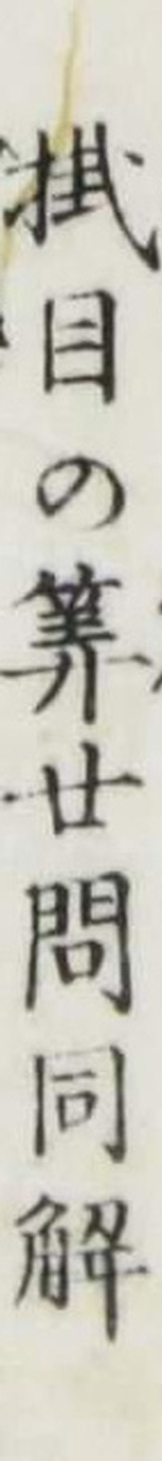掛目の算廿問同解
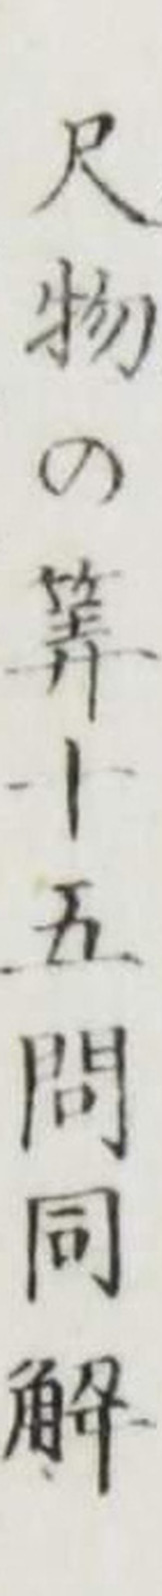尺物の算十五問同解
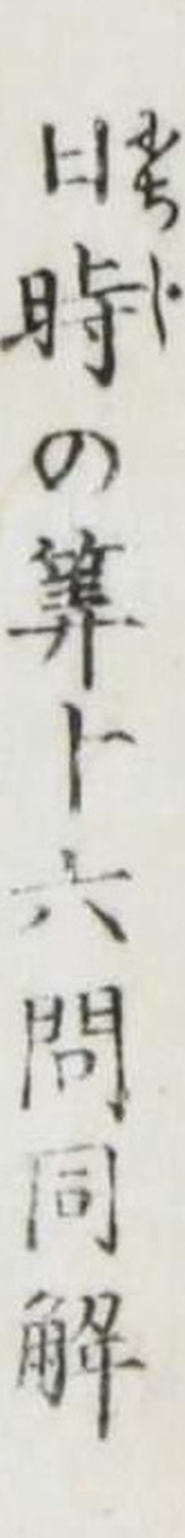日時の算十六問同解
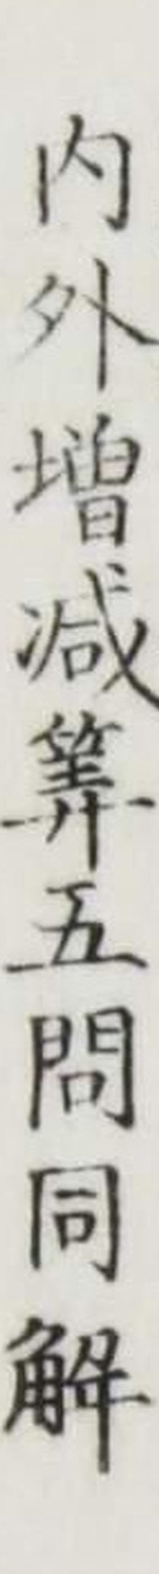内外増減算五問同解
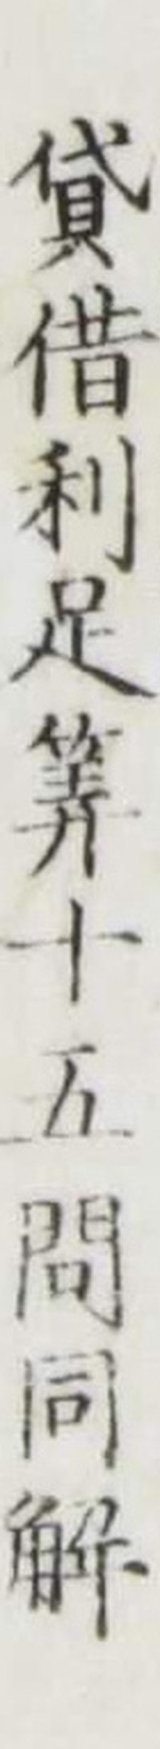貸借利足算十五問同解
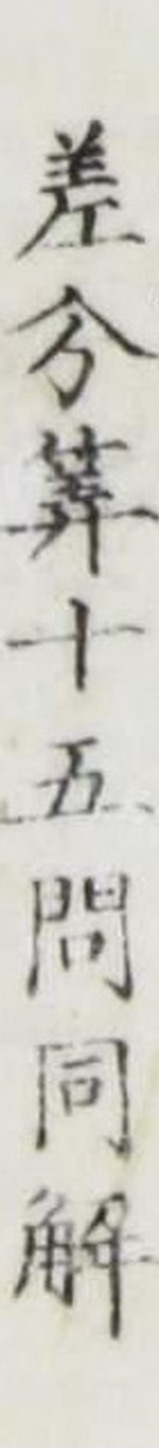差分算十五問同解
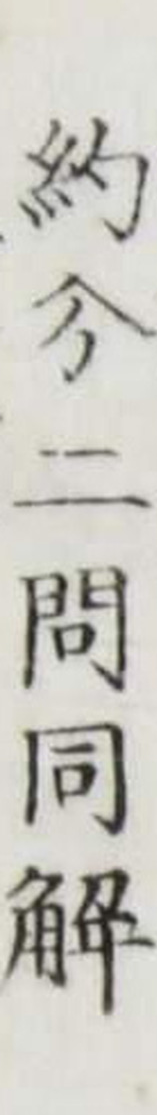約分二問同解
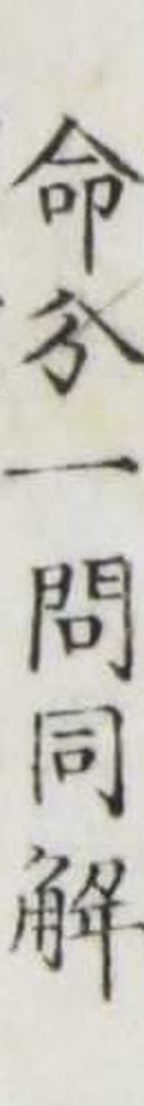命分一問同解
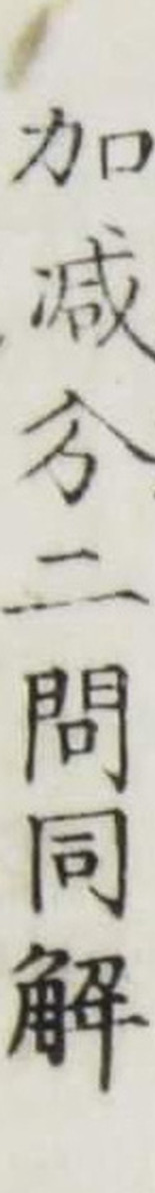加減分二問同解
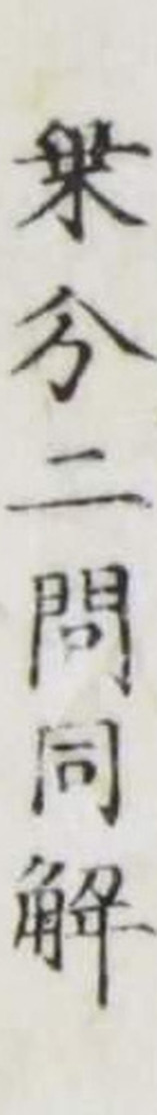乗分二問同解
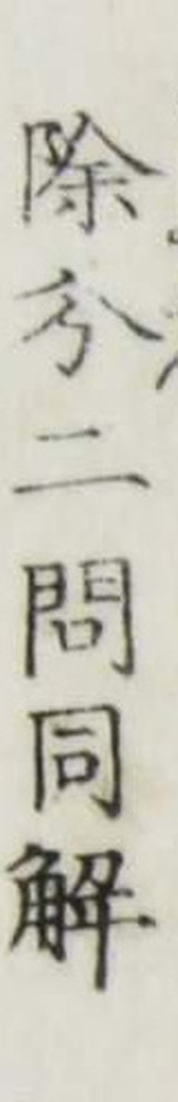除分二問同解
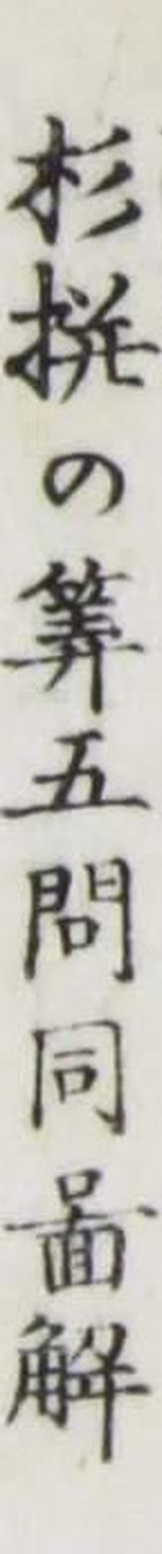杉拼の算五問同図解
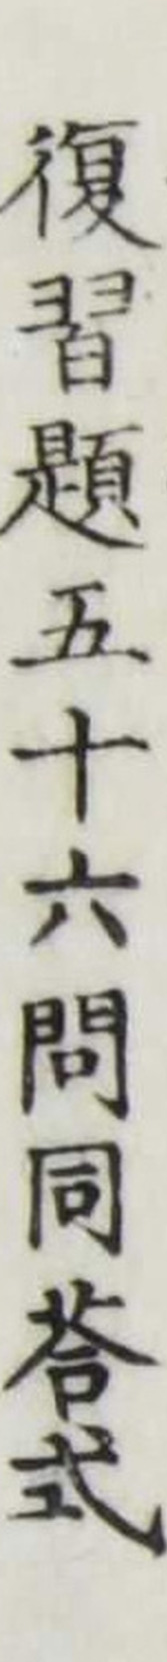復習題五十六問同答式
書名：明治小學塵劫記 卷2
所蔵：東京学芸大学教育コンテンツアーカイブ
